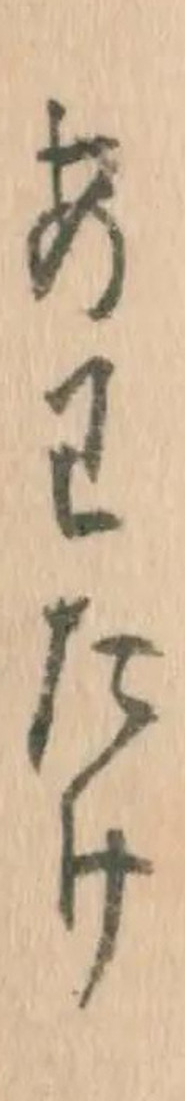あわたけ
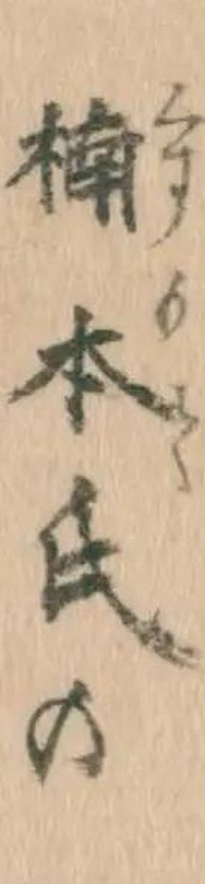楠本氏の
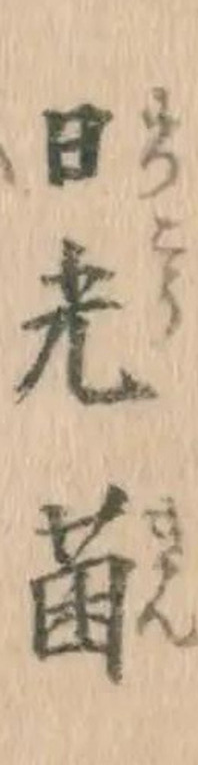日光菌

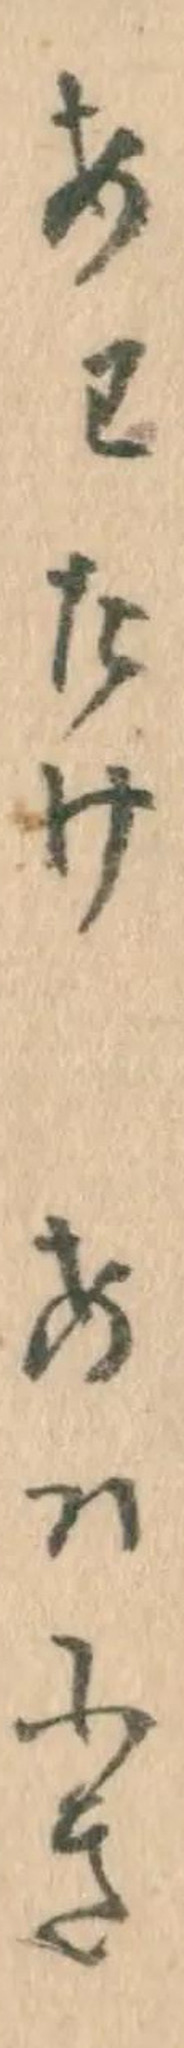あわたけあはふき
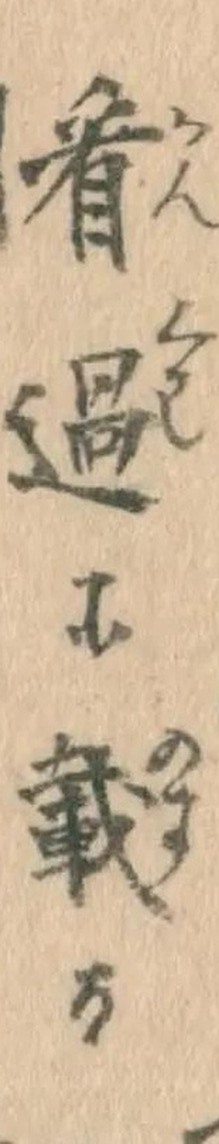看過に載る
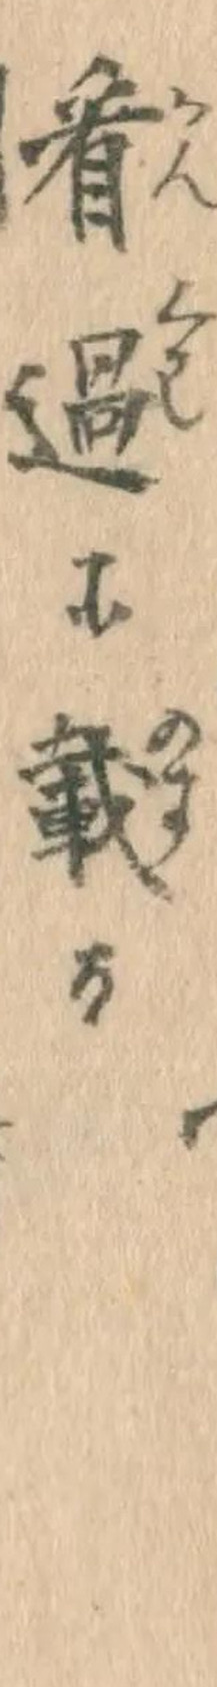看過に載る
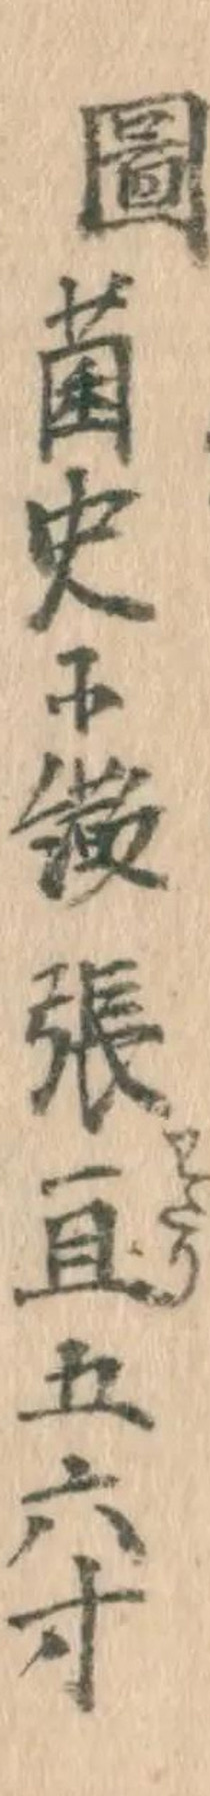図菌史に繖張亘五六寸
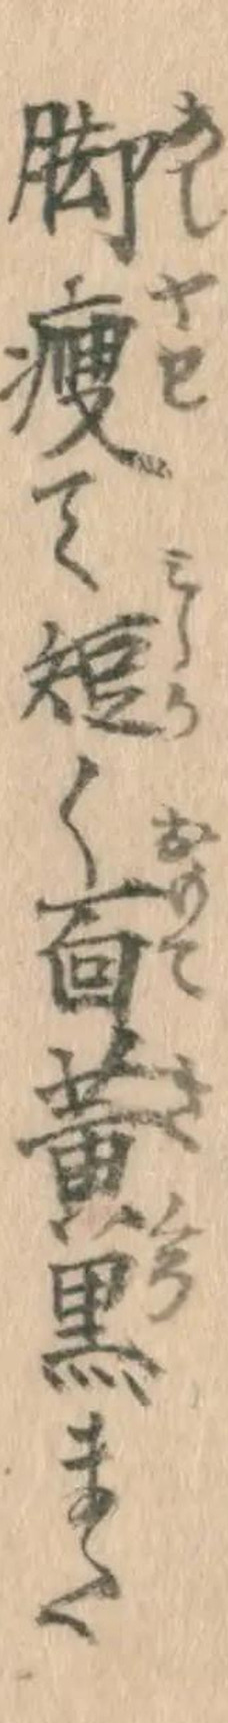脚痩て短く面黄黒また
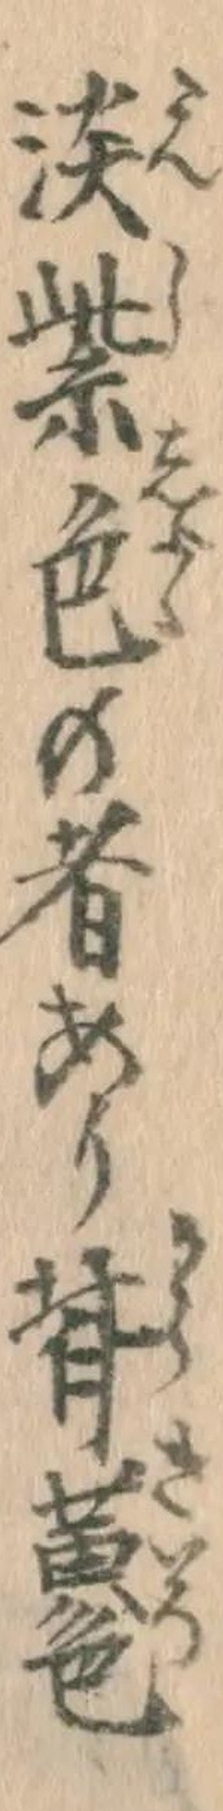淡紫色の者あり背黄色
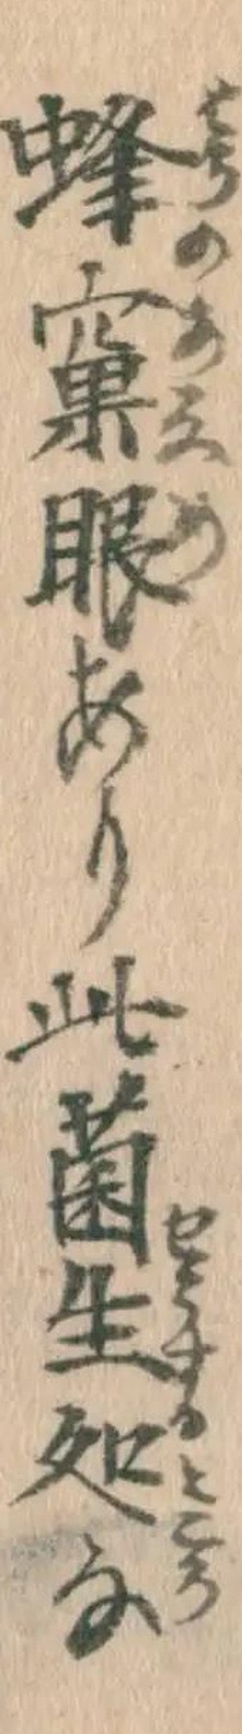蜂窠眼あり此菌生処な
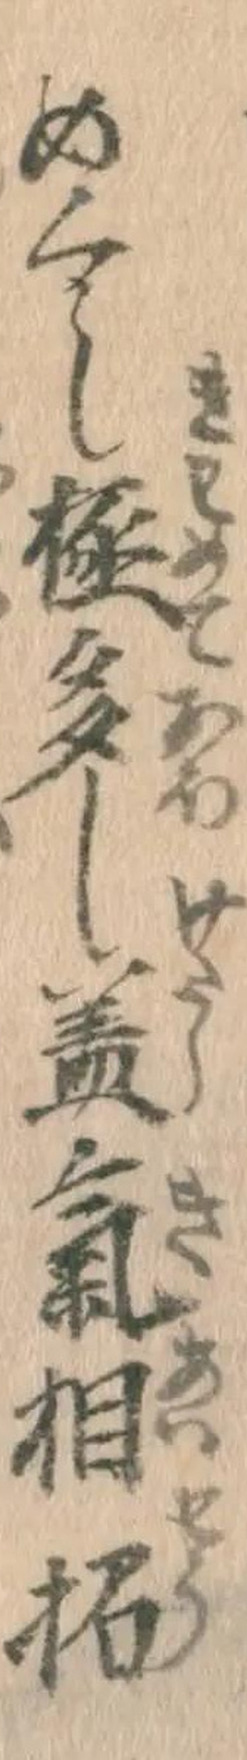めくし極多し蓋気相招
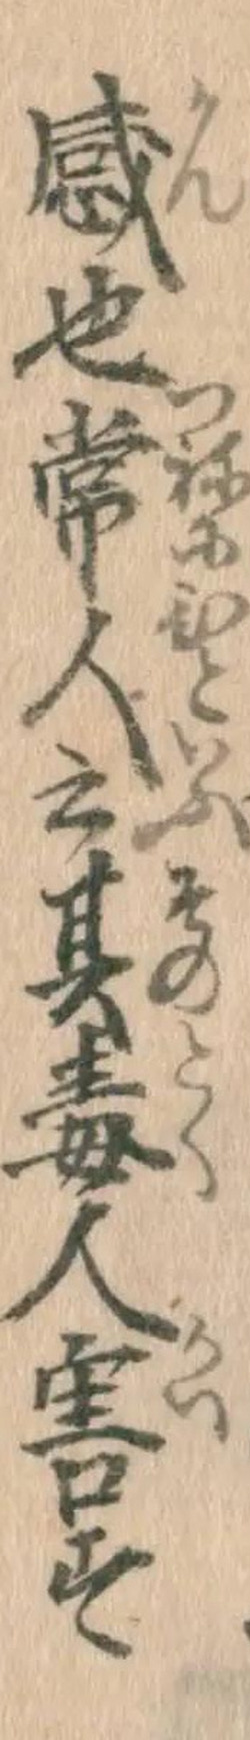感也常人云其毒人害す
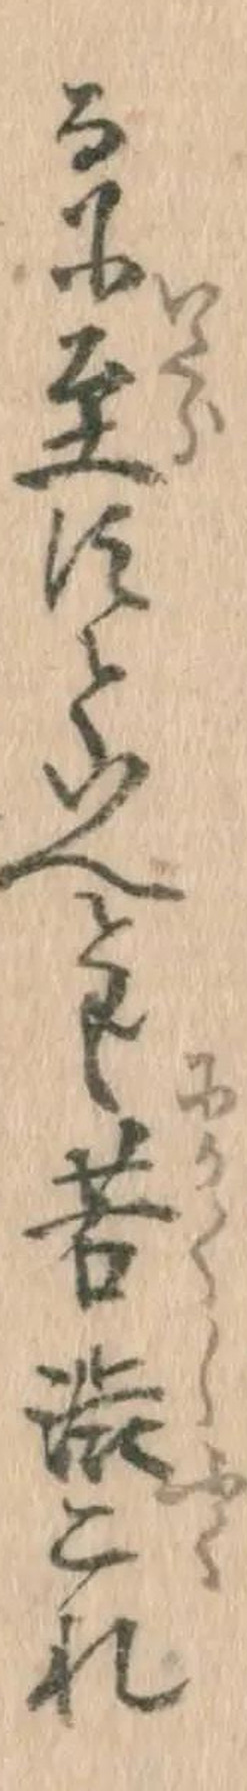るに至すといへとも苦渋これ
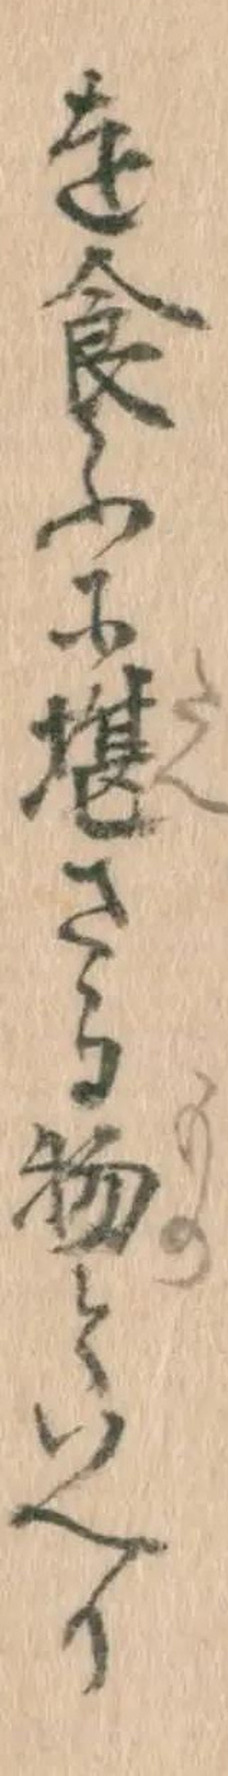を食ふに堪さる物といへり
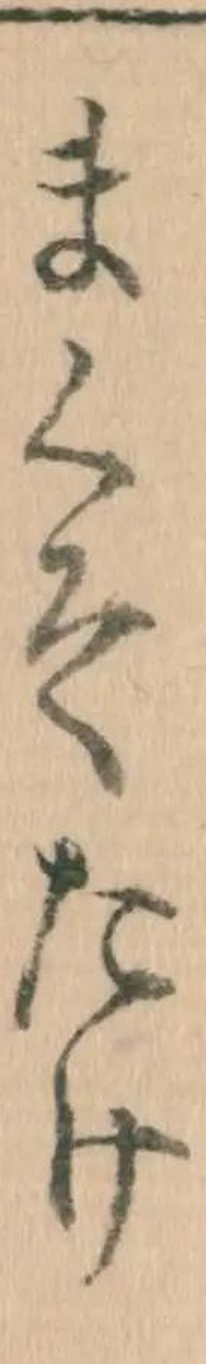まくそたけ
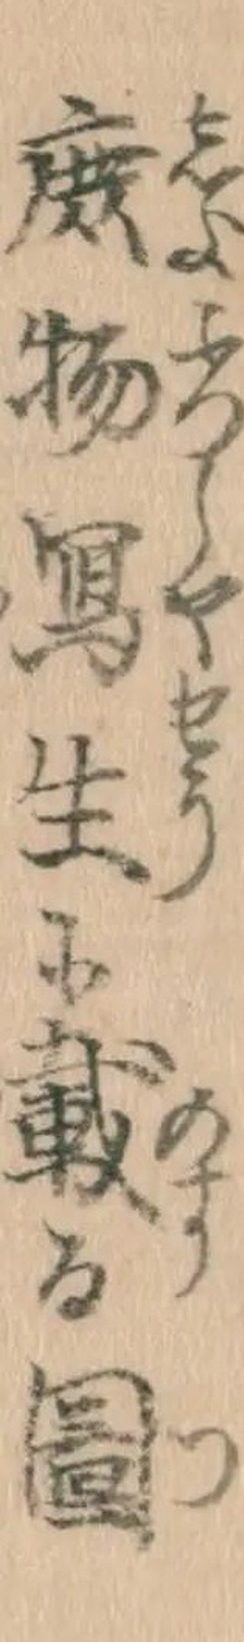庶物写生に載る図
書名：本草図譜. 巻58-60
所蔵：国立国会図書館 National Diet Library, JAPAN
